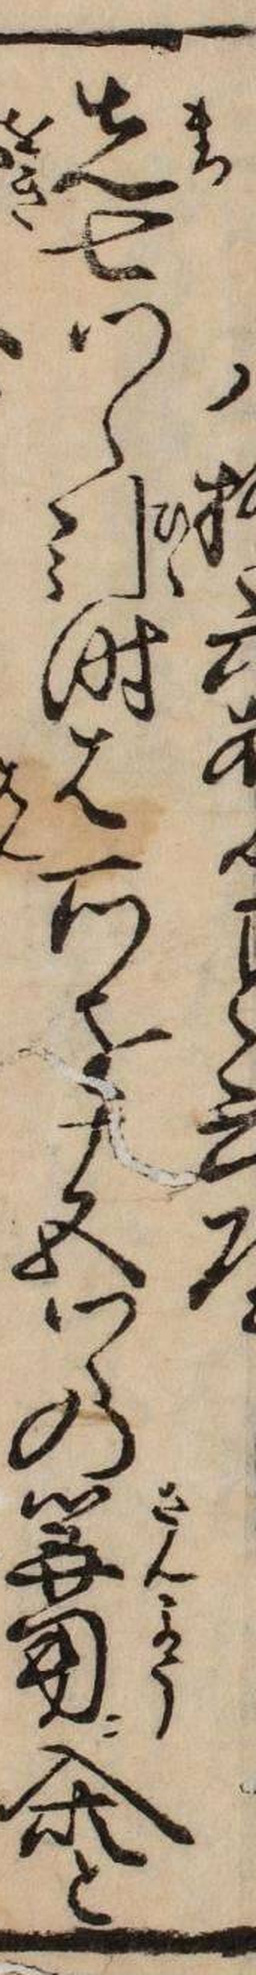先七つつ引時は一つを十五つつの算用に入卅と
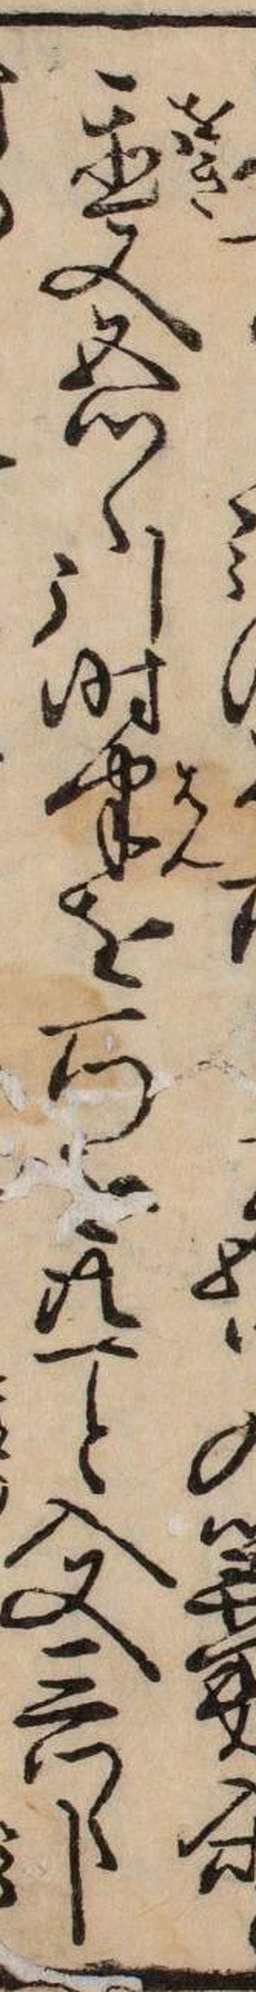置又五つつ引時半を一つを廿一と入又三つつ引
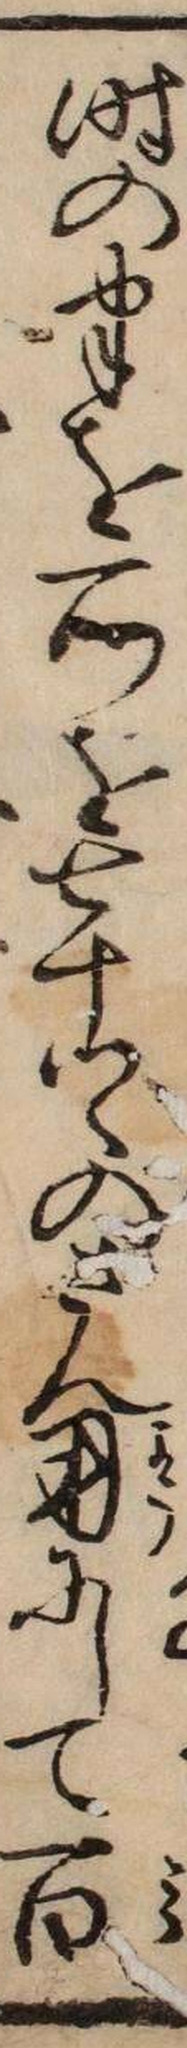時の半を一つを七十つつのさん用にして百
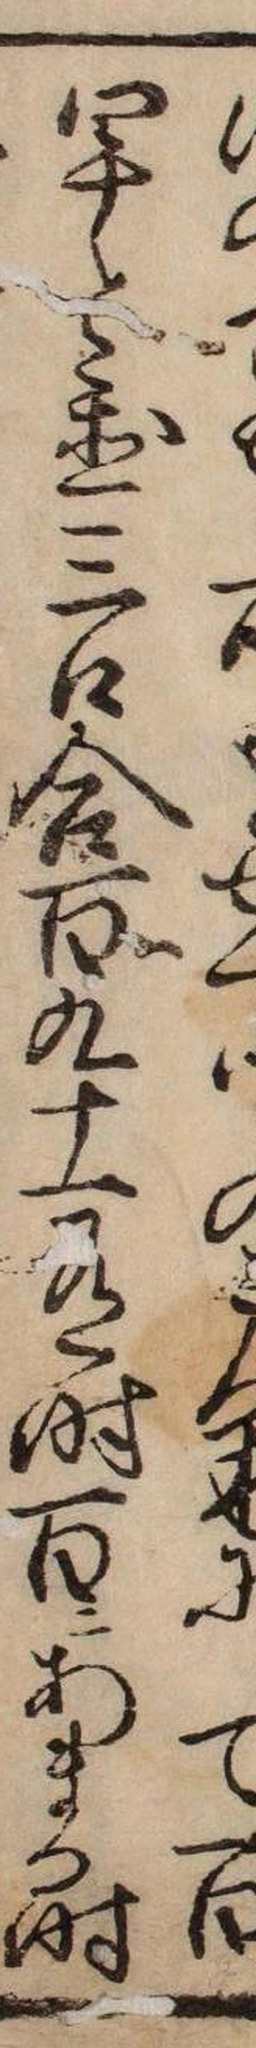四十と置三石合百九十一有時百にあまる時
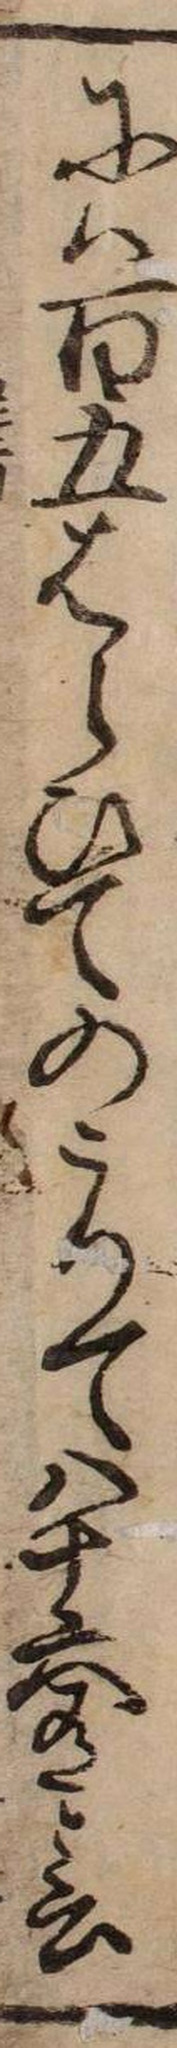には百五はらひてのこりて八十六有と云

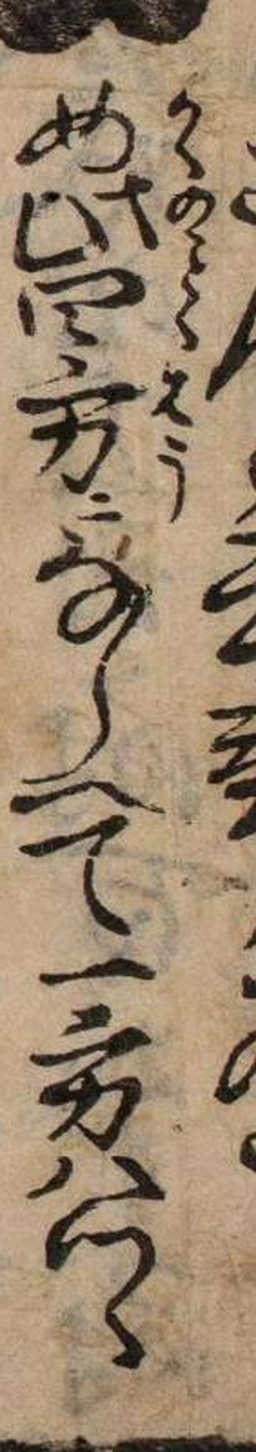如此四方にならへて一方八つつ
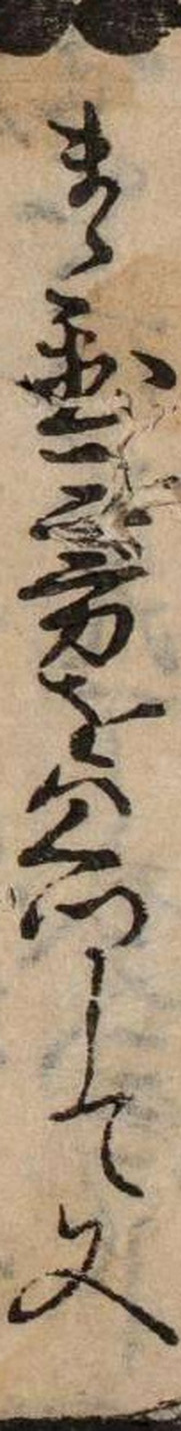まま置二方をはくつして又
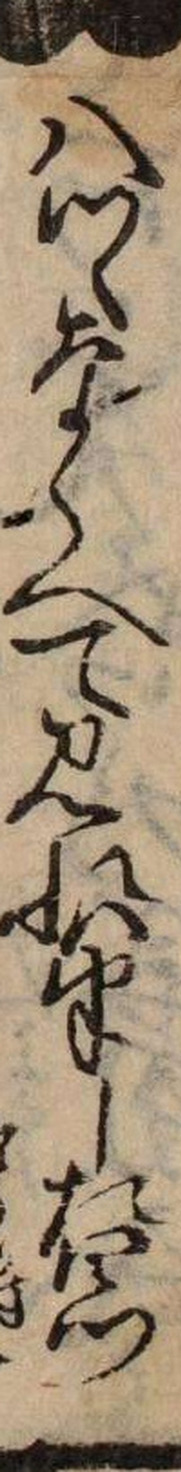八つつならへて見れは半した四つ
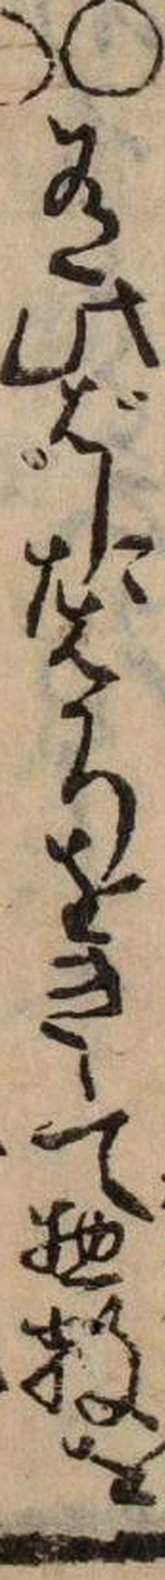有此ばしはかりをきて惣数を云也
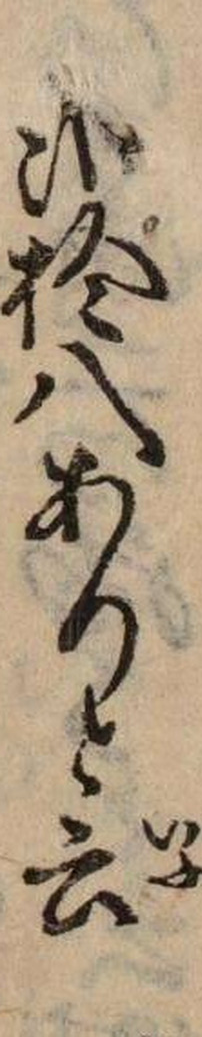弐拾八ありと云
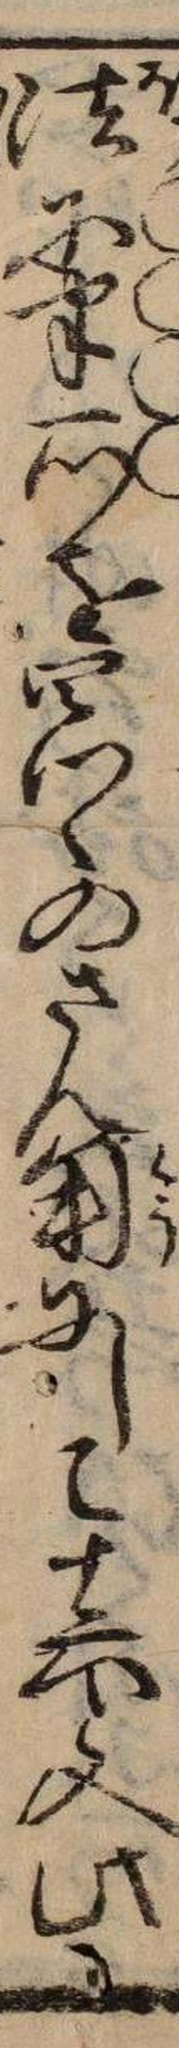法に半一つを四つつのさん用にして十六と又此
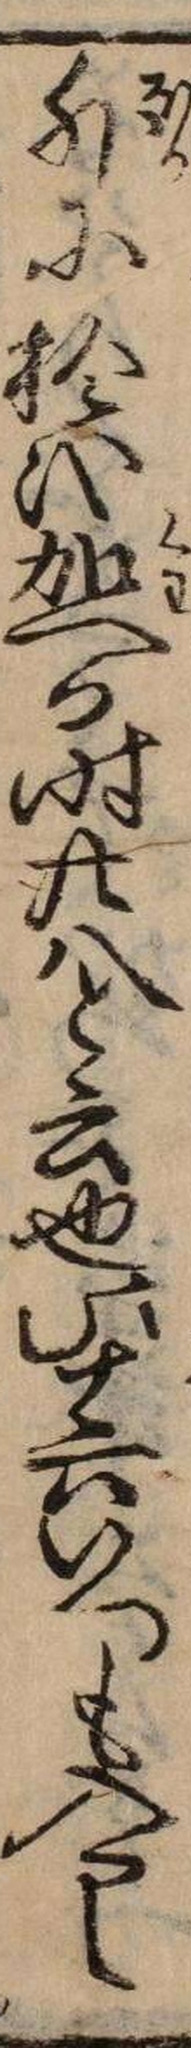外に拾弐加へる時廿八と云也此十六いつも入申候
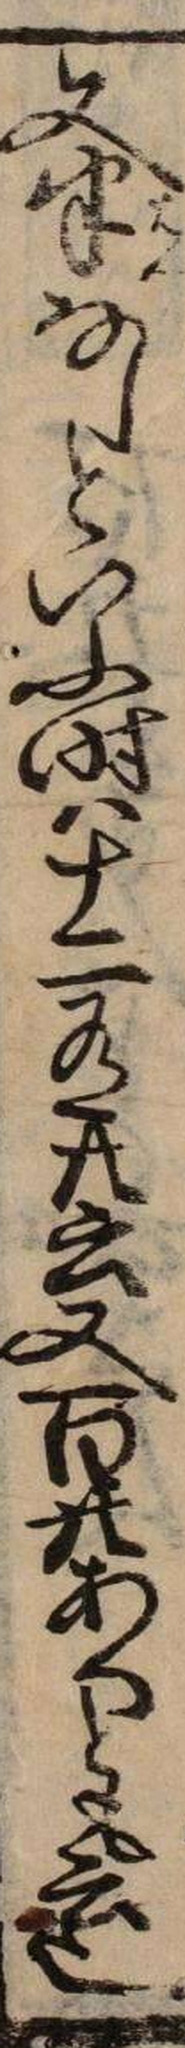又半なしといふ時は十二有共云又百廿あるとも云也
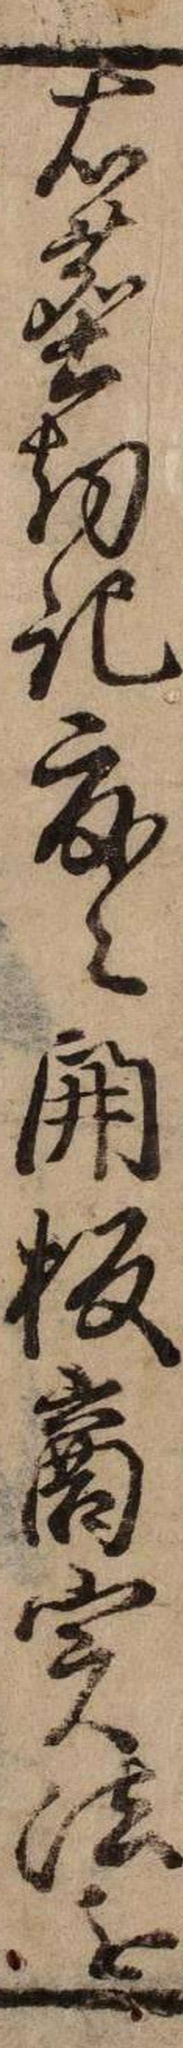右塵物記度々開板商実法を
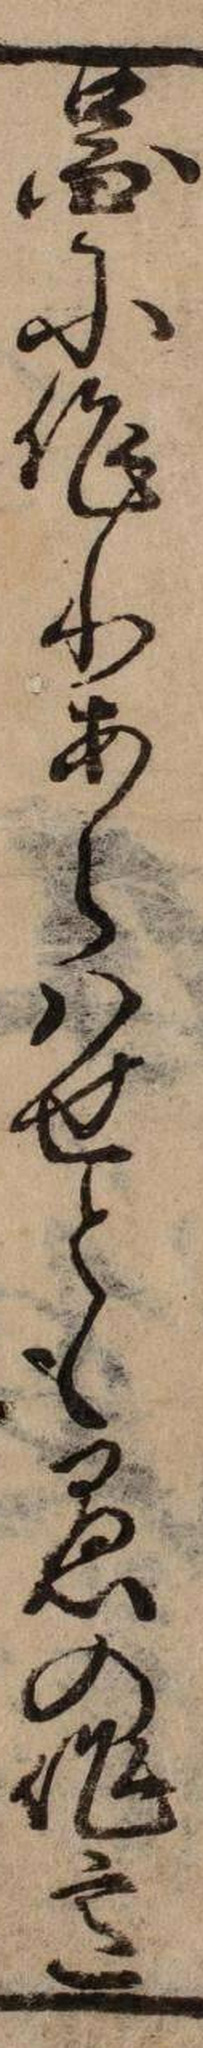圖に作りあらはせとも愚の作意
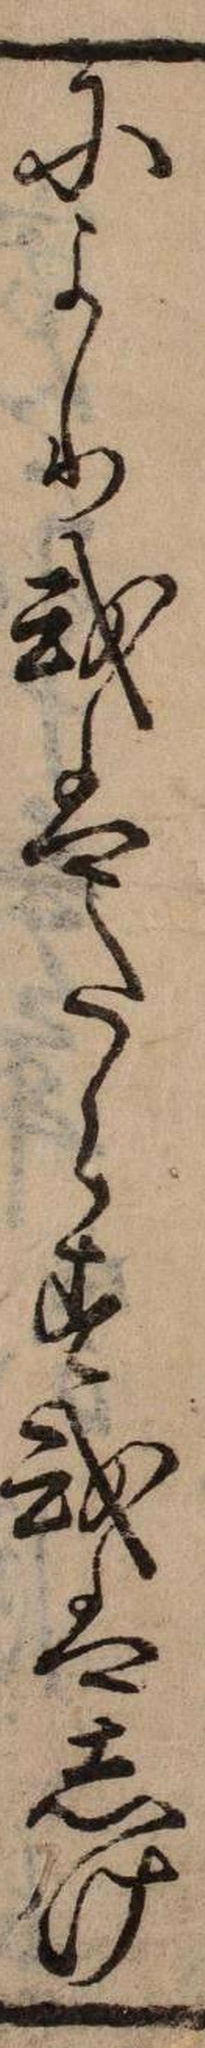により或はたらす或はしけ
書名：塵劫記（寛永11年自跋、京都府立京都学・歴彩館追貴8）
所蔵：京都府立京都学・歴彩館 国文学研究資料館
